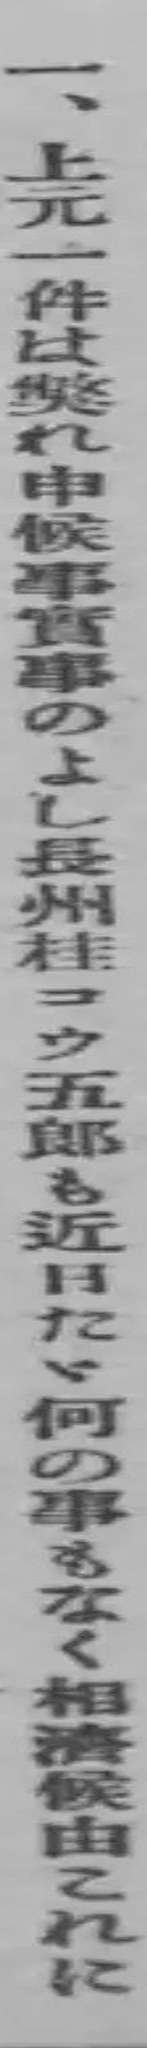一、上元一件は獘れ申候事実事のよし長州桂コウ五郎も近日たゞ何の事もなく相済候由これに
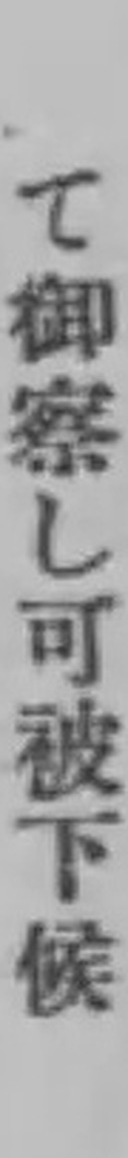て御察し可被下候
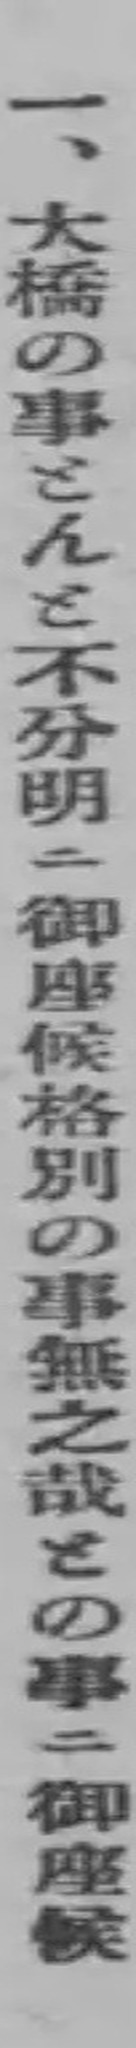一、大橋の事とんと不分明ニ御座候格別の事無之哉との事ニ御座候
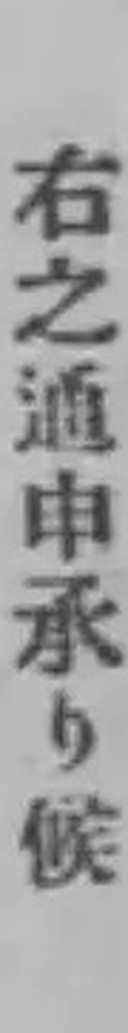右之通申承り候
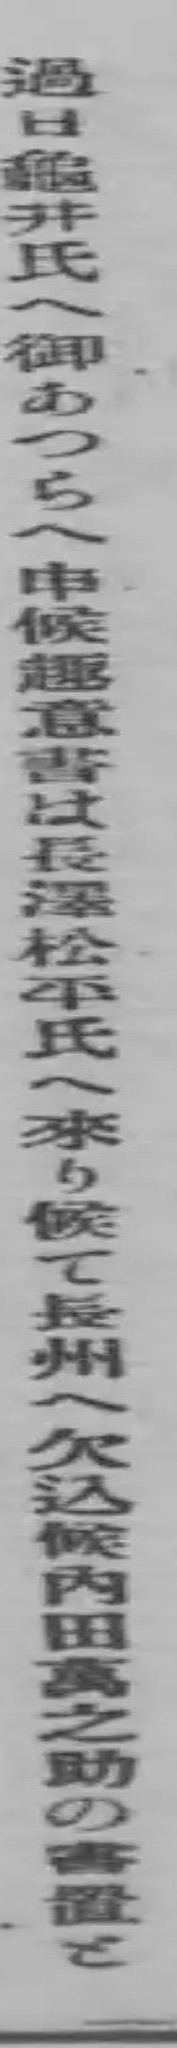過日亀井氏へ御あつらへ申候趣意書は長澤松平氏へ来り候て長州へ欠込候内田萬之助の書置と
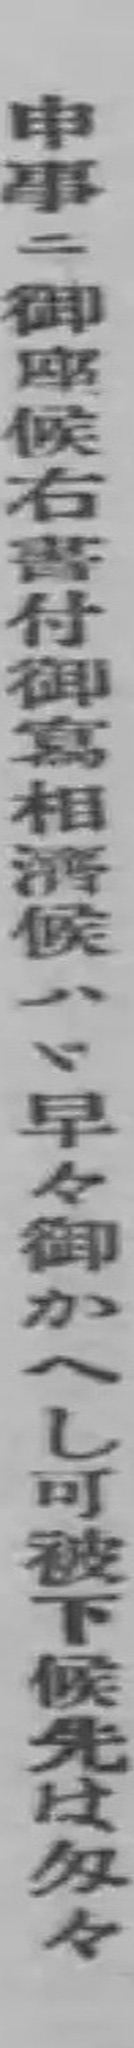申事ニ御座候右書付御写相済候はゞ早々御かへし可被下候先は匁々
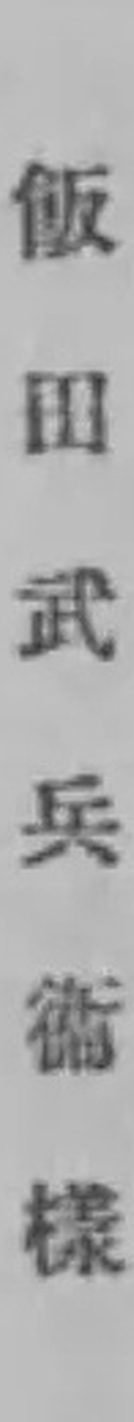飯田武兵衛様
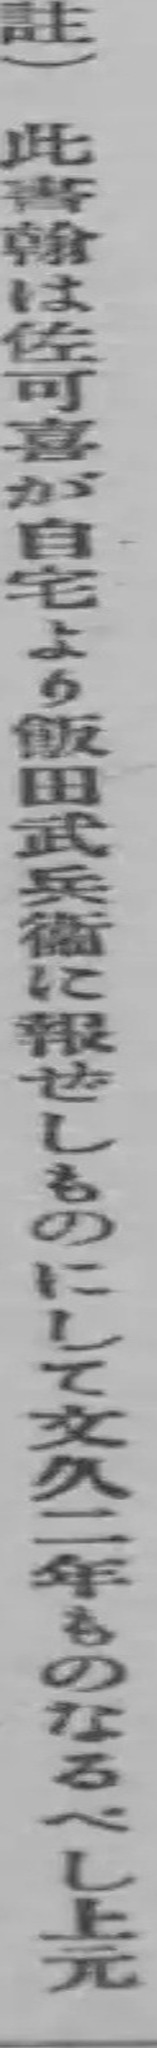(註)此書翰は佐可喜が自宅より飯田武兵衛に報ぜしものにして文久二年ものなるべし上元
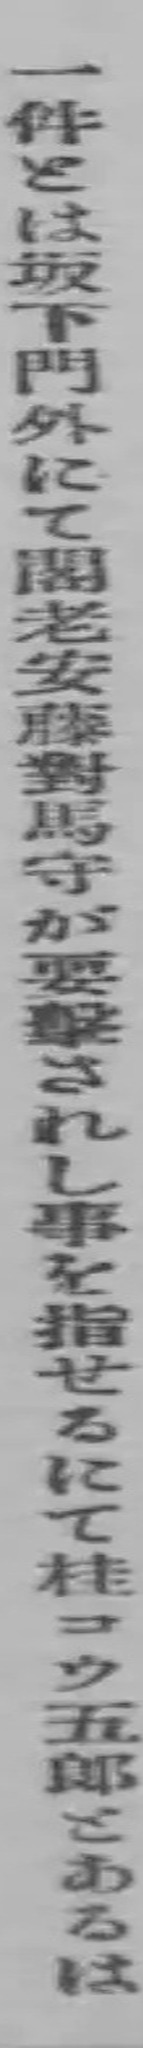一件とは坂下門外にて閣老安藤対馬守が要撃されし事を指せるにて桂コウ五郎とあるは
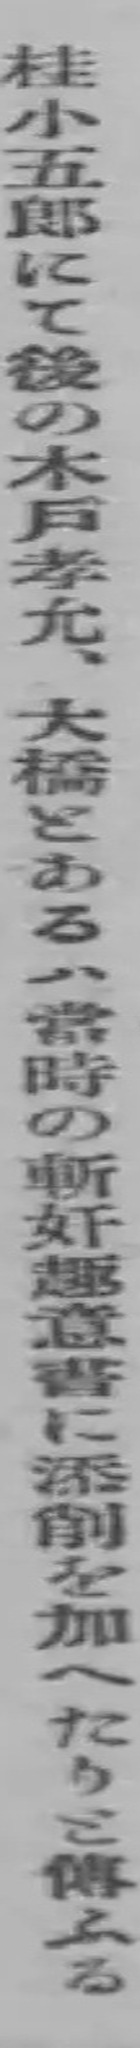桂小五郎にて後の木戸孝允、大橋とあるは当時の斬奸趣意書に添削を加へたりと伝ふる
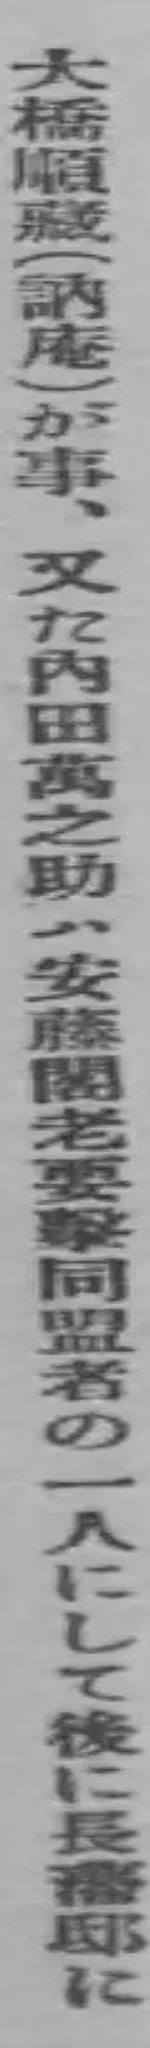大橋順蔵(訥庵)が事、又た内田萬之助は安藤閣老要撃同盟者の一人にして後に長藩邸に

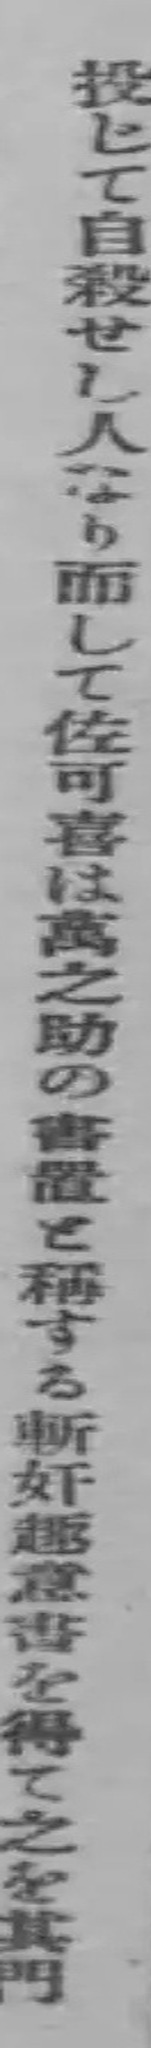投じて自殺せし人なり而して佐可喜は萬之助の書置と称する斬奸趣意書を得て之を其門
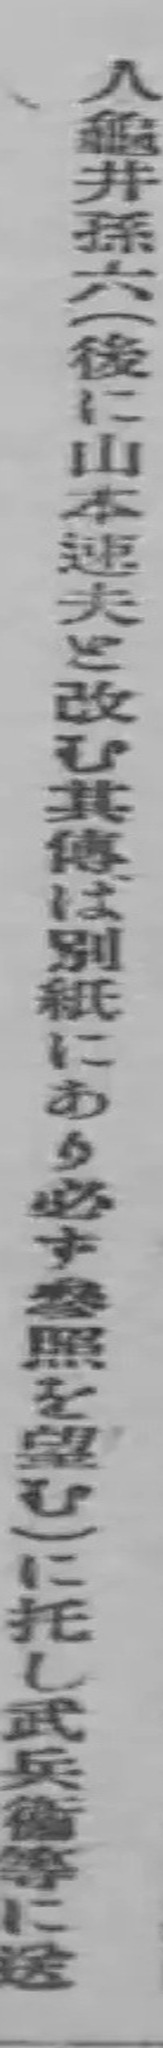人亀井孫六(後に山本速夫と改む其伝は別紙にあり必ず参照を望む)に托し武兵衛等に送
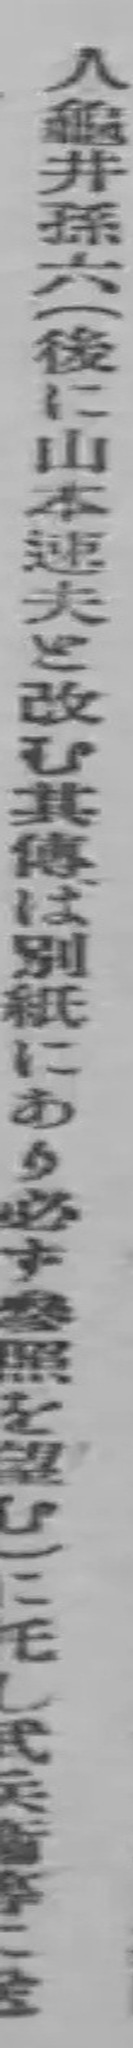人亀井孫六(後に山本速夫と改む其伝は別紙にあり必ず参照を望む)に托し武兵衛等に送
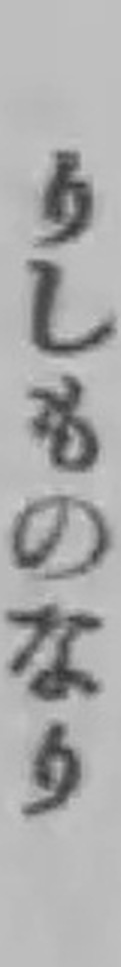りしものなり
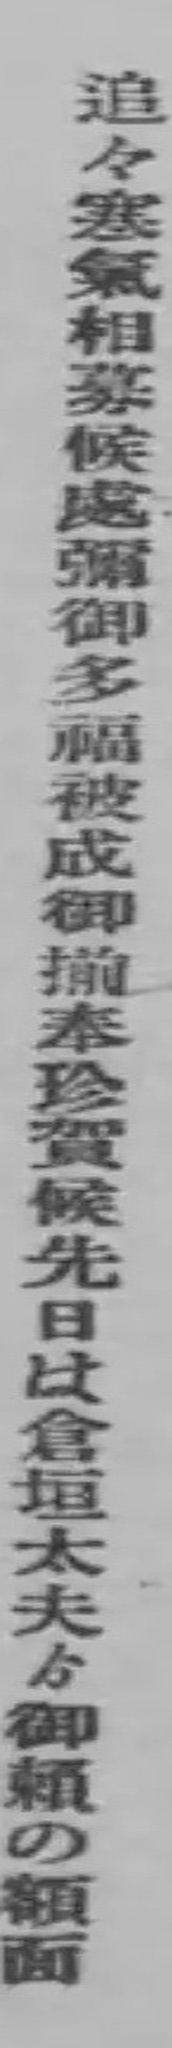追々寒気相募候処弥御多福被成御揃奉珍賀候先日は倉垣太夫ゟ御頼の額面
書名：豊橋市史談
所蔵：国立国会図書館 National Diet Library, JAPAN
